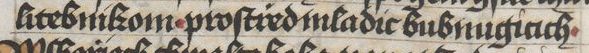litebnikom.proſtṙed mladic bubnugicich.
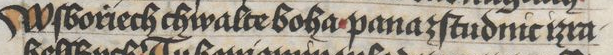Wſboṙiech chwalte boha.pana zſtudnic Izra¬
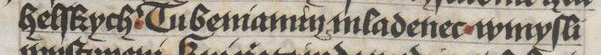helſkych.Tubeniamin mladenec.wmyſli
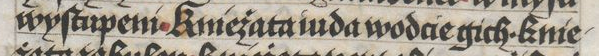wyſtupení.Knieżata iuda wodcie gich.knie¬
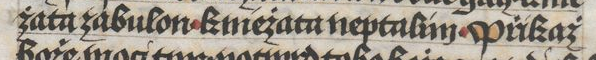żata zabulon.kníežata neptalim.Pṙíkaż
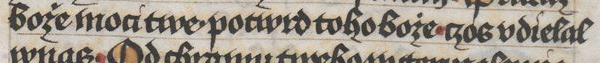boże moci twe.potwrd toho boże.czos vdielal
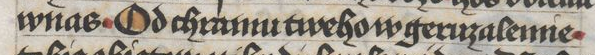wnas.Od chramu tweho w geruzalemie.
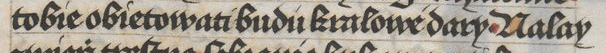tobie obietowati budú kralowé dary.Nalay
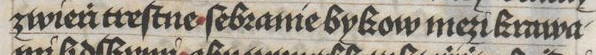zwieṙi treſtne.ſebranie bykow mezi krawa¬
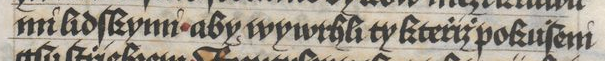mi lidſkymi.aby wywrhli ty kteṙíż pokuẛeni
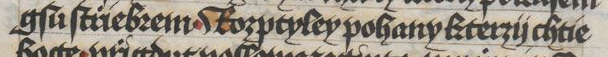gſu ſtṙíebrem.Rozptyley pohany kterzij chtíe
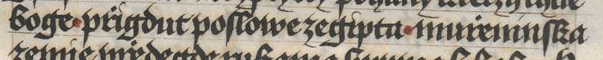boge.pṙigdut poſlowe zegipta.muṙenínſka
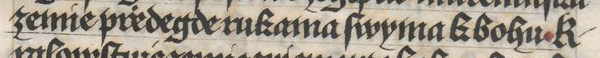zemie pṙedegde rukama ſwyma k bohu.K¬
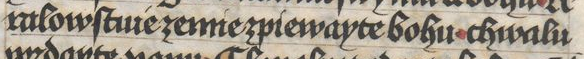ralowſtuie zemie zpiewayte bohu.chwalu
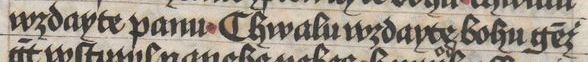wzdayte panu.Chuwalu wzdayte bohu gēż
